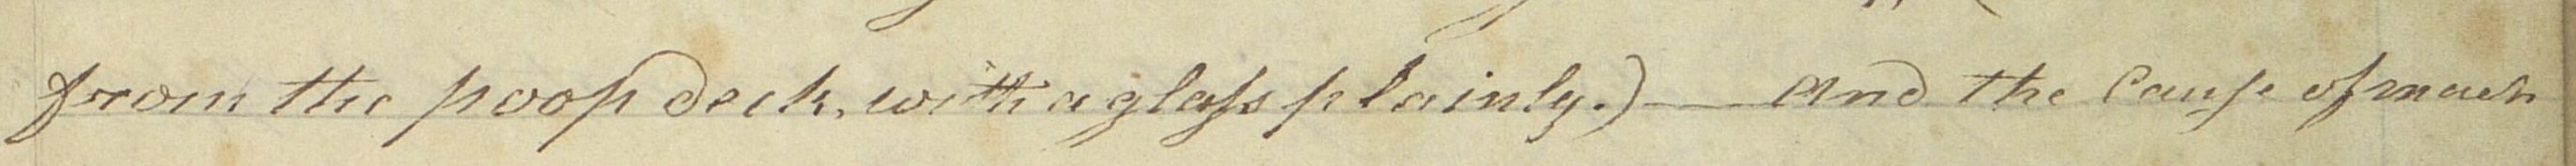from the poop deck with a glass plainly.) And the Cause of much
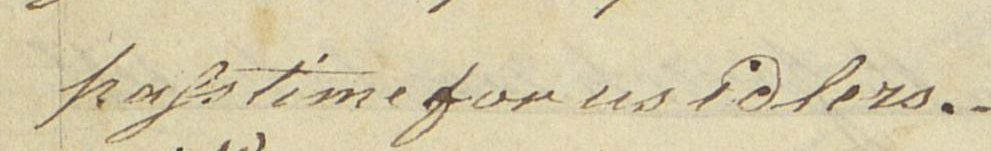passtime for us idlers.
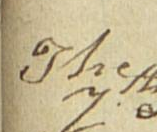The
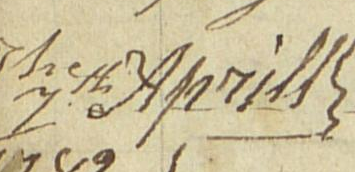7^th Aprill
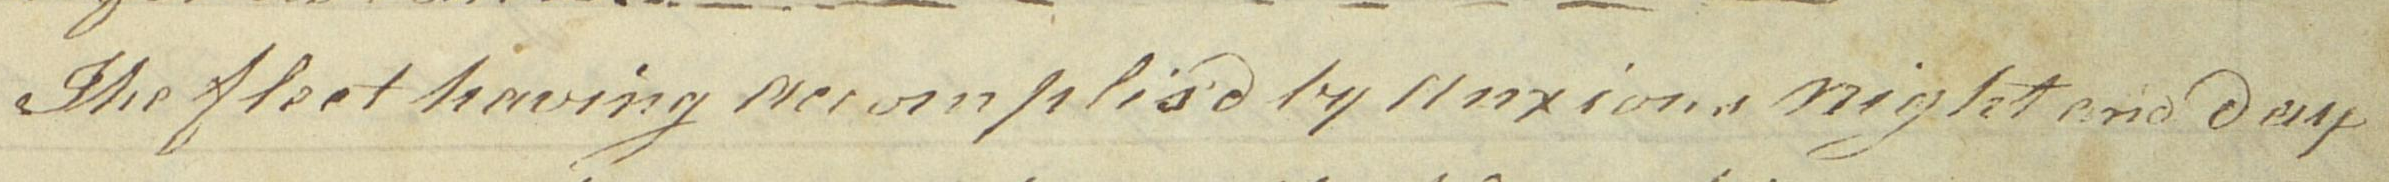The fleet having accomplisd by anxious Night and day
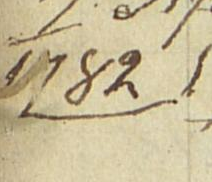1782
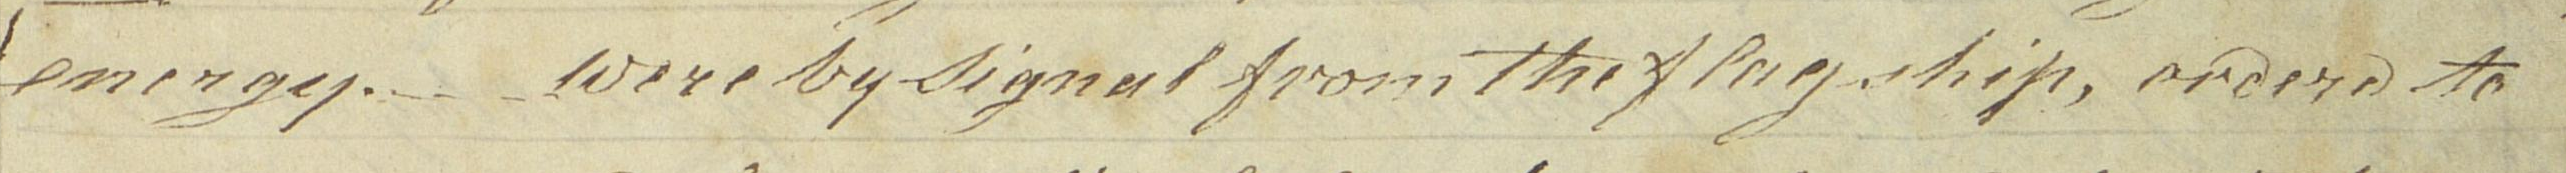energy. were by signal from the flag ship, orderd to
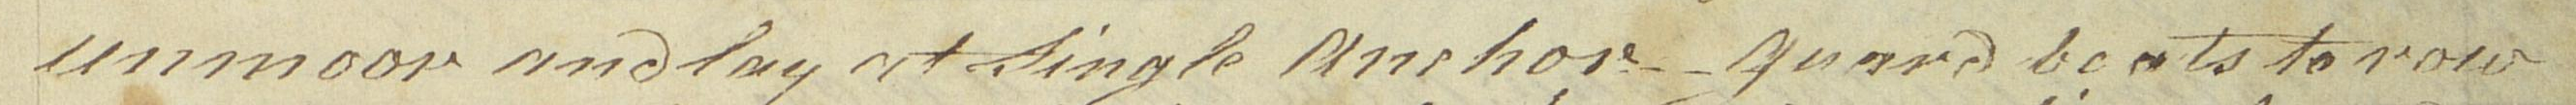unmoor and lay at Single Anchor guard boats to row
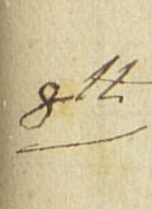8^th
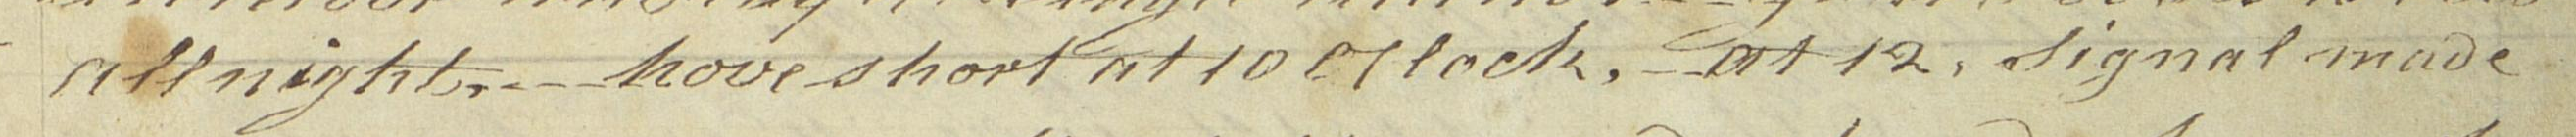all night, hove short at 10 OClock. At 12, Signal made
